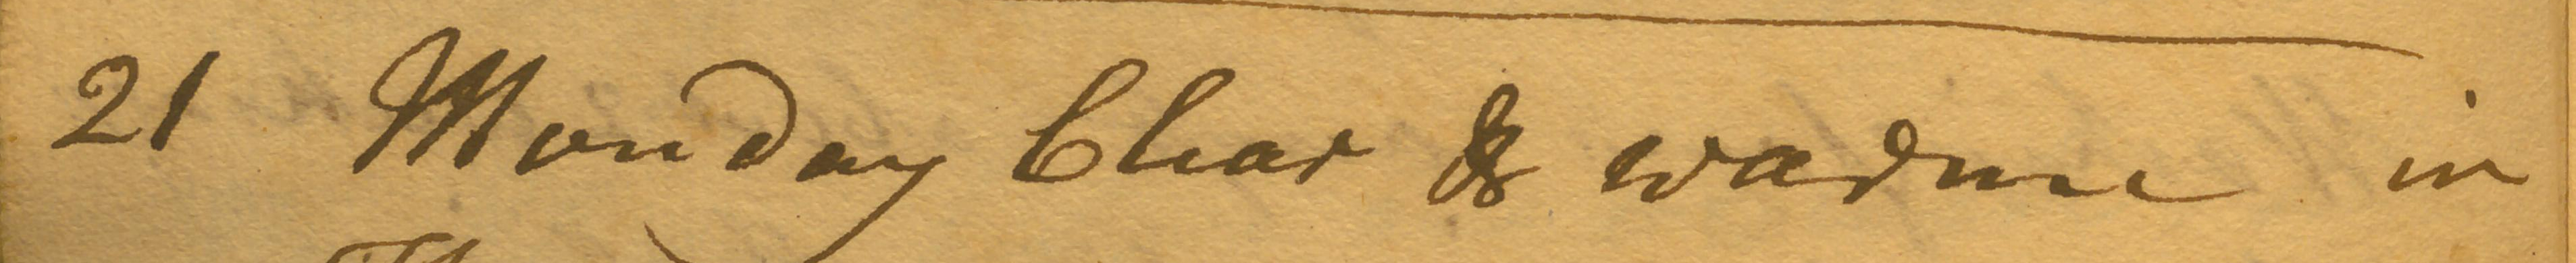21 Monday Clear & warme in
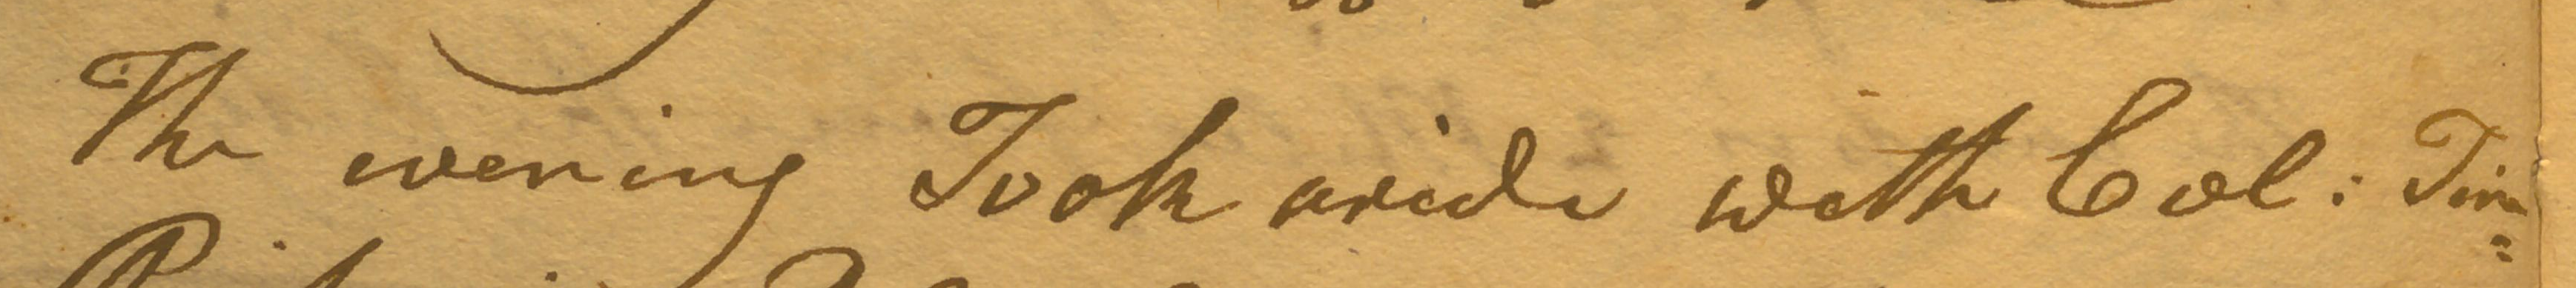the evening Took a ride with Col: Tim
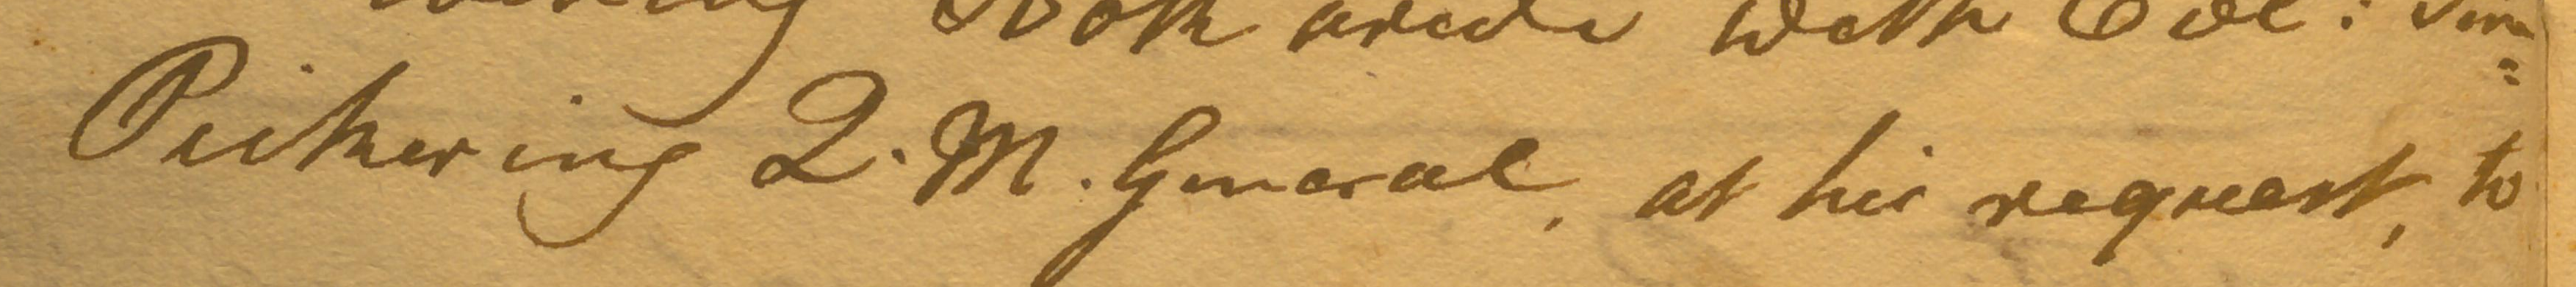Pickering Q. M. General at his request to
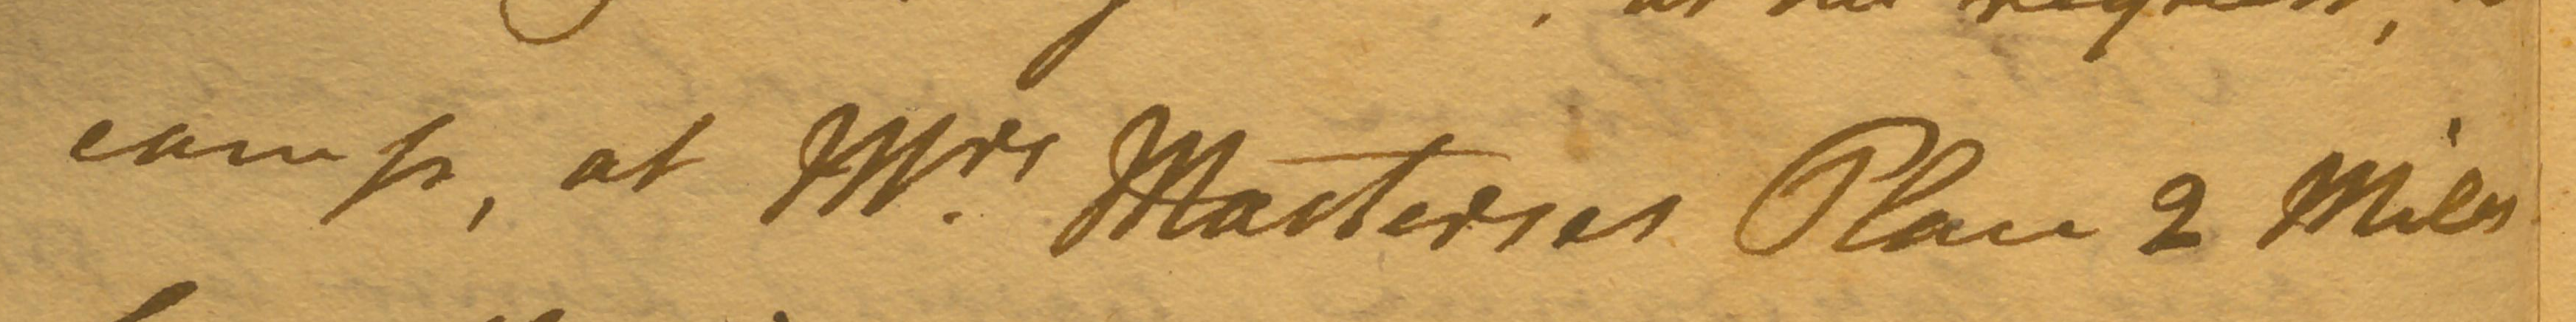camp, at M^rs. Masterses Place 2 Miles
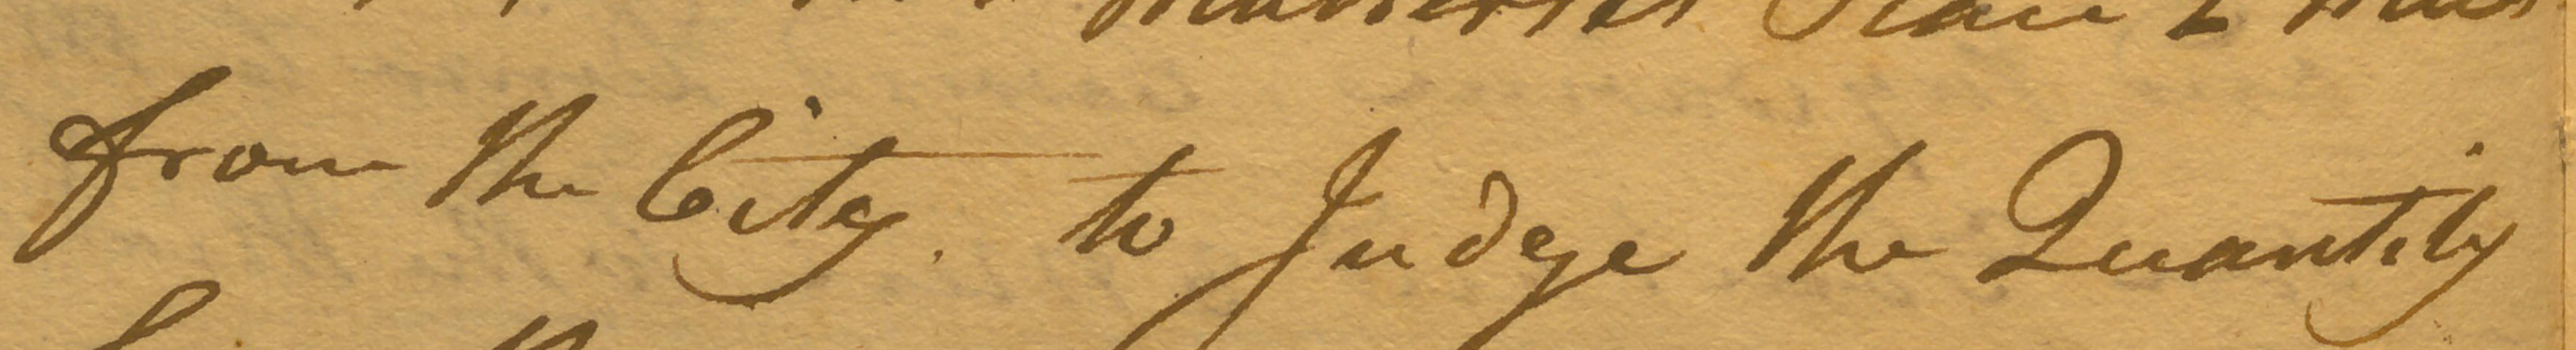from the City to Judge the Quantity
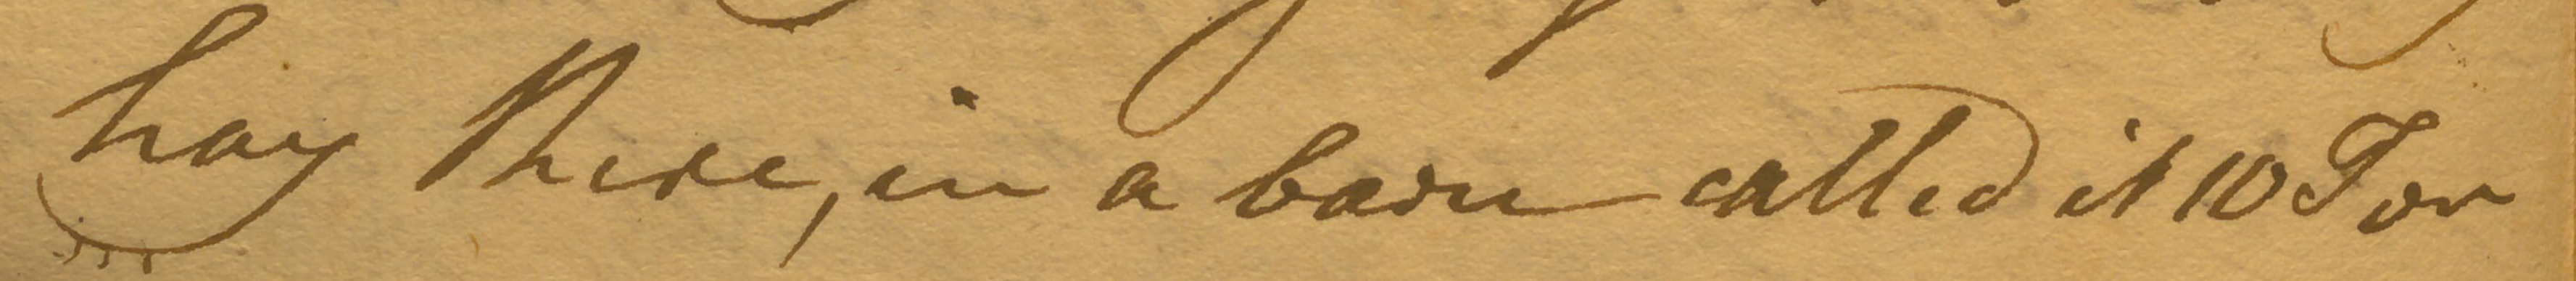hay there, in a barn called it 10 Ton
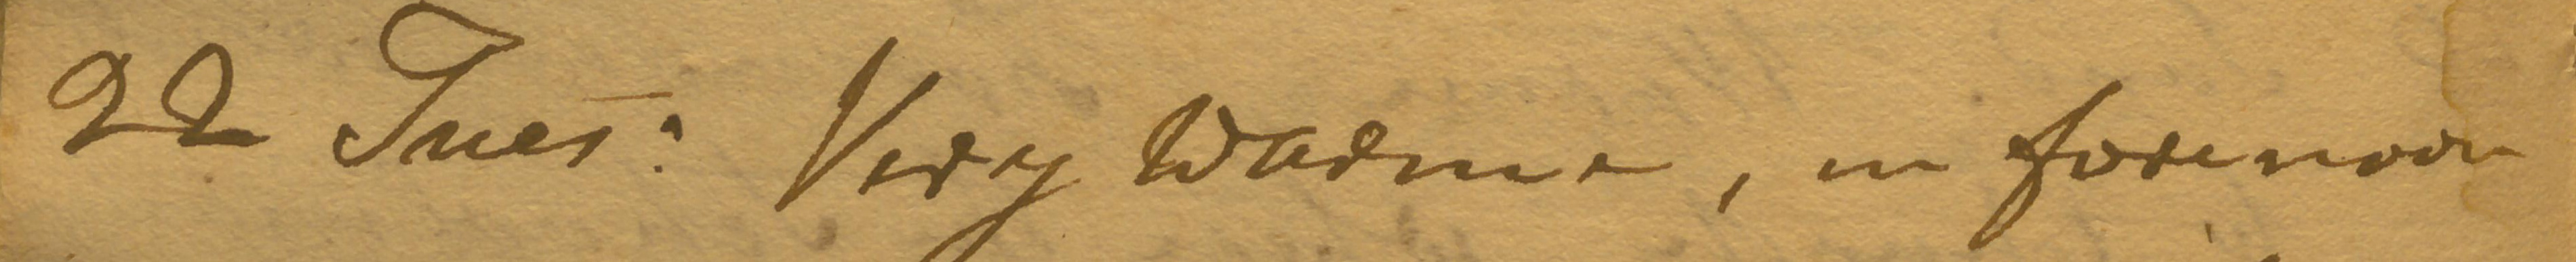22 Tues: Very Warme, in forenoon
